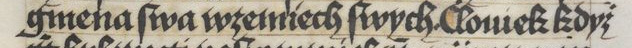gmena ſwa wzemíech ſwych.Ċlouiek když
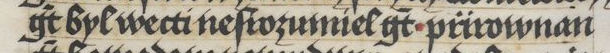ḡt byl wecti neſrozumiel ḡt.pṙirownan
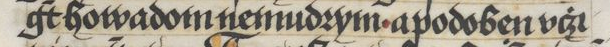ḡt howadom nemudrym.a podoben vcżi¬
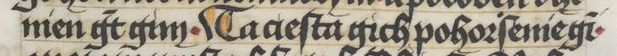níen ḡt gím.Ta cieſta gich pohorẛeníe gī.
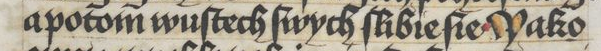a potom wuſtech ſwych ſlibie ſie.Yako
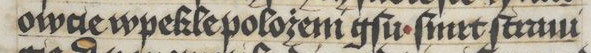owcie w pekle polożení gſu.ſmrt ſtrauí
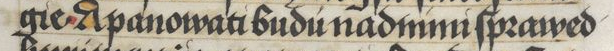gie.A panowati budú nadními ſprawed¬
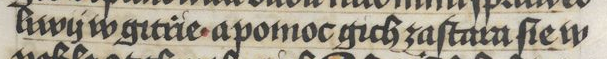liwij w gitṙie.a pomoc gich zaſtara ſie w
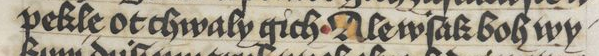pekle ot chwaly gich.Ale wẛak boh wy¬
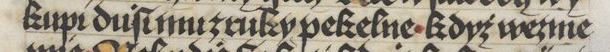kupí duẛi mu z ruky pekelne.když wezme
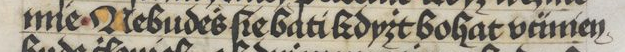mie.Nebudeṡ ſie bati kdyžt bohat vċíníen
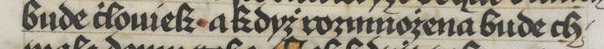bude ċlouíek.a kdyż rozmnożena bude ch¬
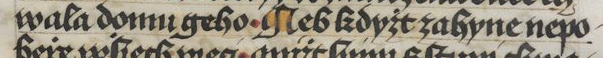wala domu geho.Neb kdyżt zahyne nepo¬
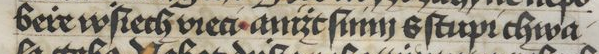beṙe wẛiech viecí.aníżt ſním sſtupí chwa¬
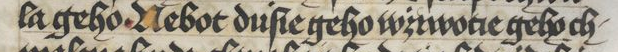la geho.Nebot duẛie geho wżiwotie geho ch¬
